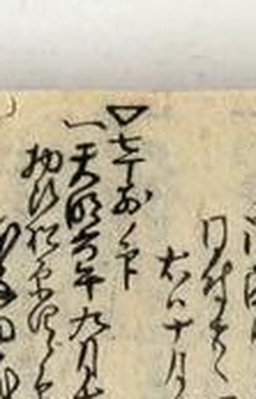▽七丁前之印
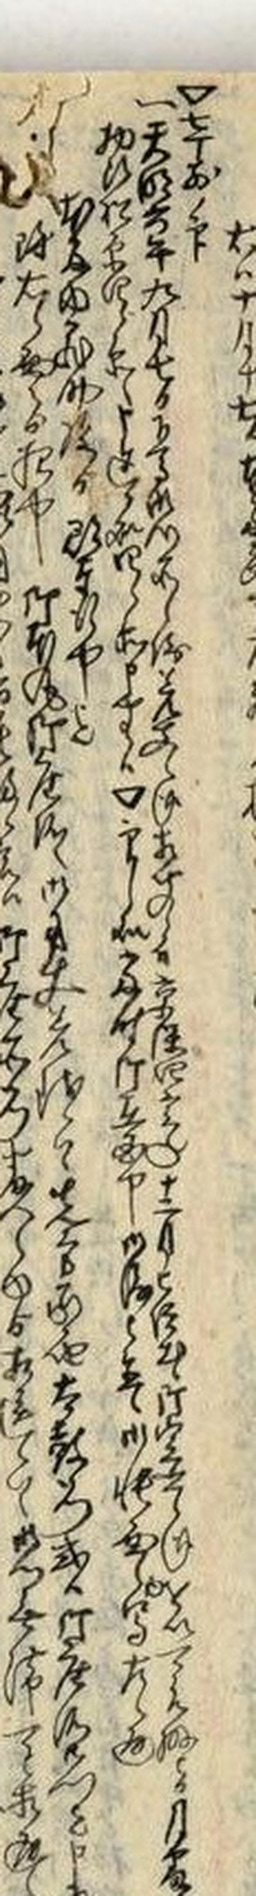物頭松原四郎兵衛へ申達候処四郎兵衛申聞候ハ▽四郎兵衛当時御在国中御側被置候御帳面之内写左之通
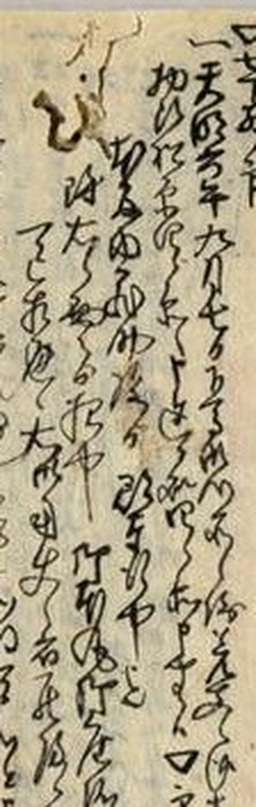本多内蔵助殿ゟ郡奉行中迄
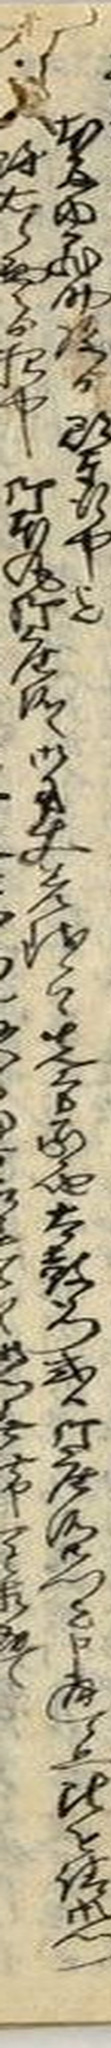附右之面々ゟ夜中御本丸御座所へ御用使差越候ハヽ先方承届太鼓御門或ハ御座所御門迄申通候上断を請御門
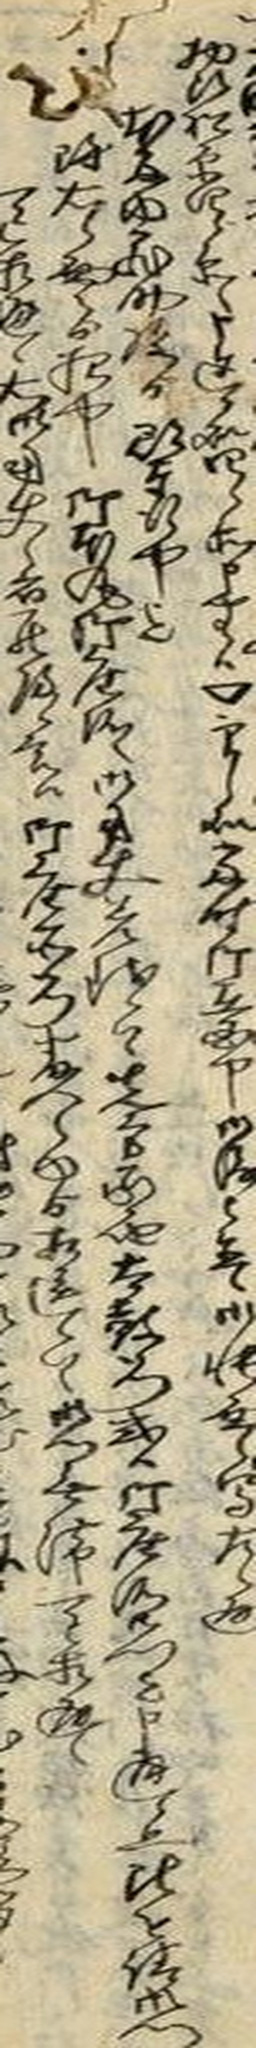可被相通候右御用使之者罷帰候節ハ御座所御門番人之内ゟ相送候ハヽ御門無滞可被相通候
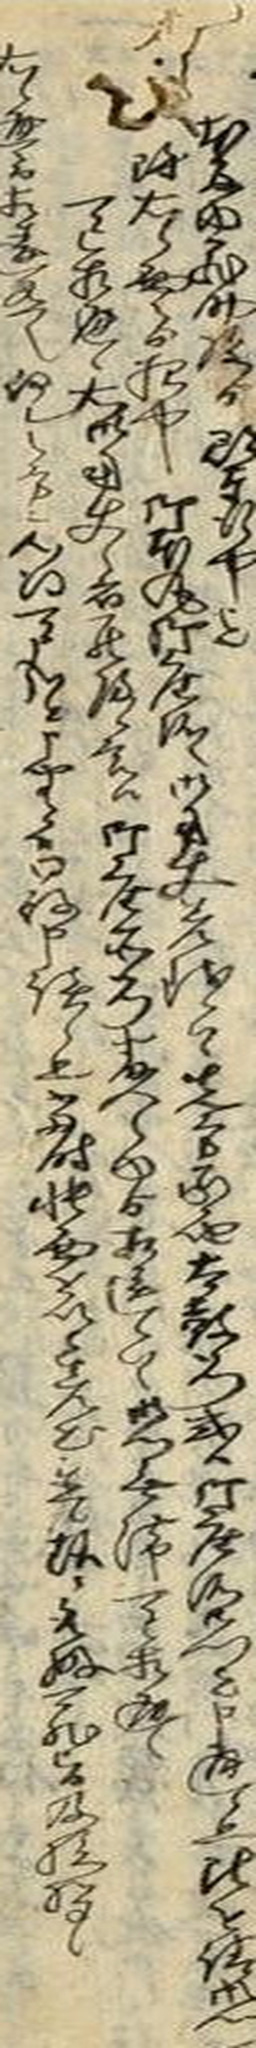右之通相違有之何レ之方ニ心得可申哉と申聞候付同役申談之上当時帳面を以差出置候趣ニ取扱可然旨及挨拶候

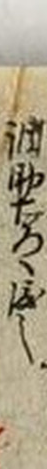調助右衛門へ渡之
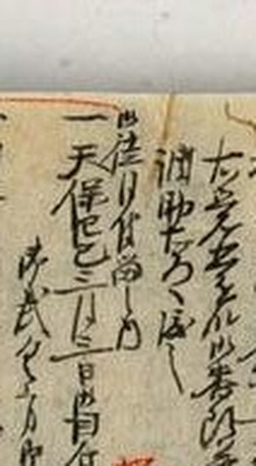御徒目付留之内
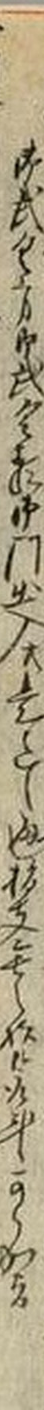御武具方御武具類御門出入共是迄之通指支無之候様御取斗可被成旨
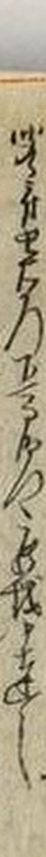聞候付長右衛門下馬御門へ罷越申達之
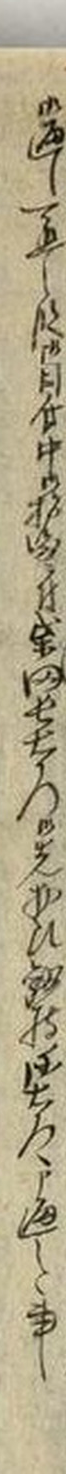御通し可通段御目付中御指図ニ付柴田長右衛門御先物頭剣持弥右衛門へ申通候事

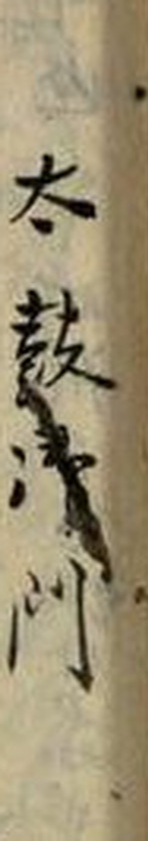太鼓御門
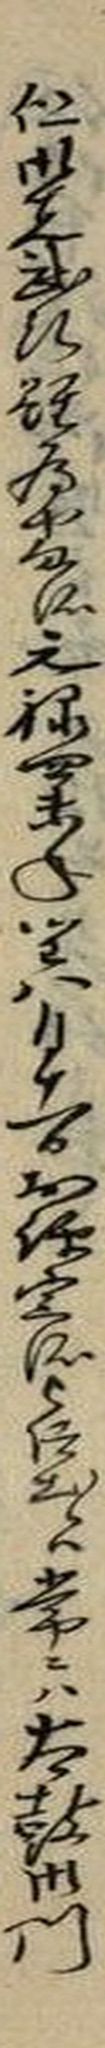但御先武頭難為番所元禄四未年閏八月十一日於評定所被仰出候ハ常ニハ太鼓御門
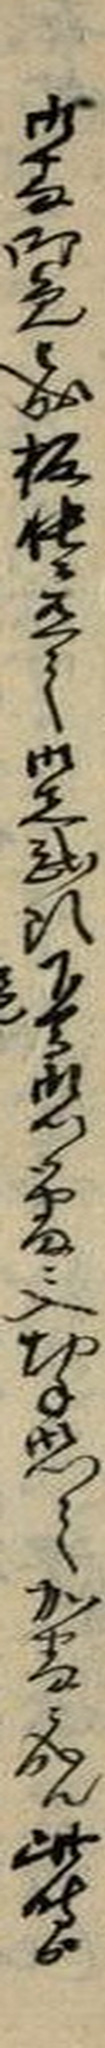御番御免被成板帳ニ有之御先武頭下馬御門御番ニ入切手御門之加番被成ル此時ゟ
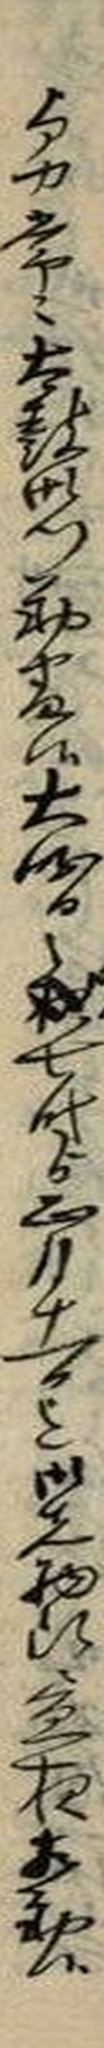与力常ニ太鼓御門勤番候大晦日之晩七時ゟ正月七日迄御先物頭ニ昼夜相勤候
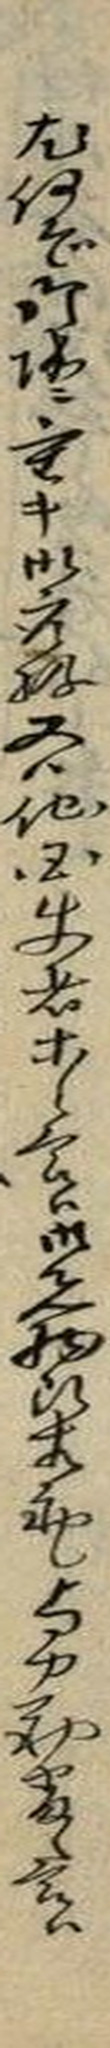尤何ぞ御城ニ重キ御取扱又ハ他国使者等之節御先物頭相勤候与力勤番之節ハ
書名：御門御櫓之部
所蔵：福井県文書館 Fukui Prefectural Archives
